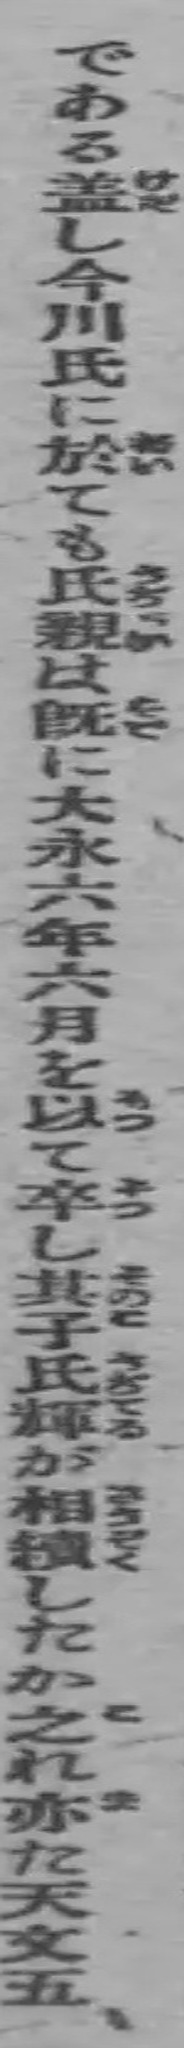である蓋し今川氏に於ても氏親は既に大永六年六月を以て卒し其子氏輝が相続したか之れ亦た天文五
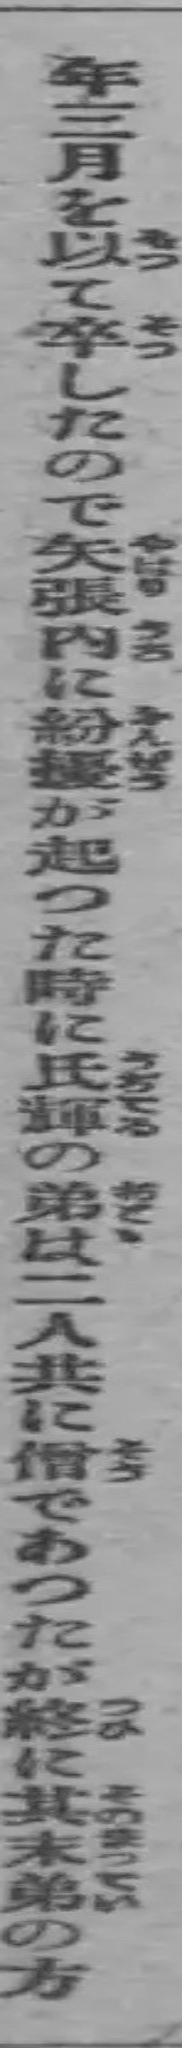年三月を以て卒したので矢張内に紛擾が起つた時に氏輝の弟は二人共に僧であつたが終に其末弟の方

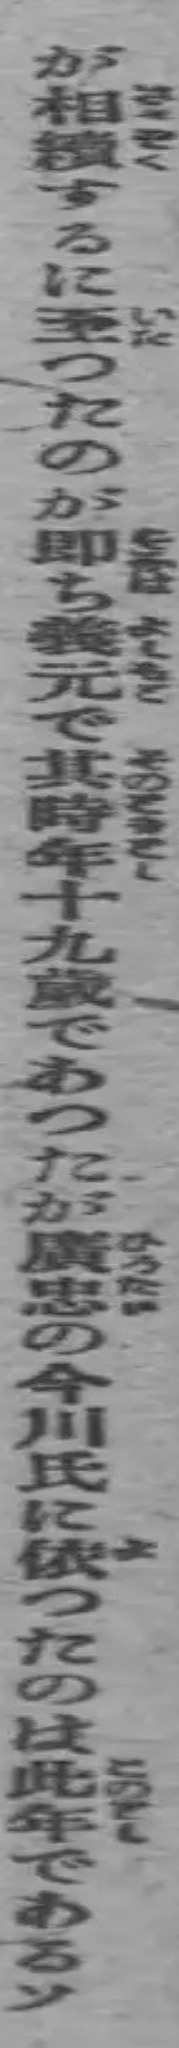が相続するに至つたのが即ち義元で其時年十九歳であつたが広忠の今川氏に依つたのは此年であるソ
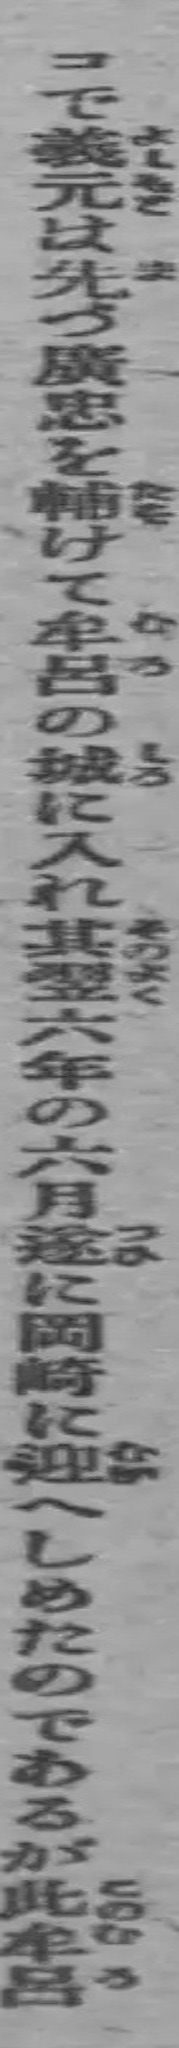コで義元は先づ広忠を輔けて牟呂の城に入れ其翌六年の六月遂に岡崎に迎へしめたのであるが此牟呂
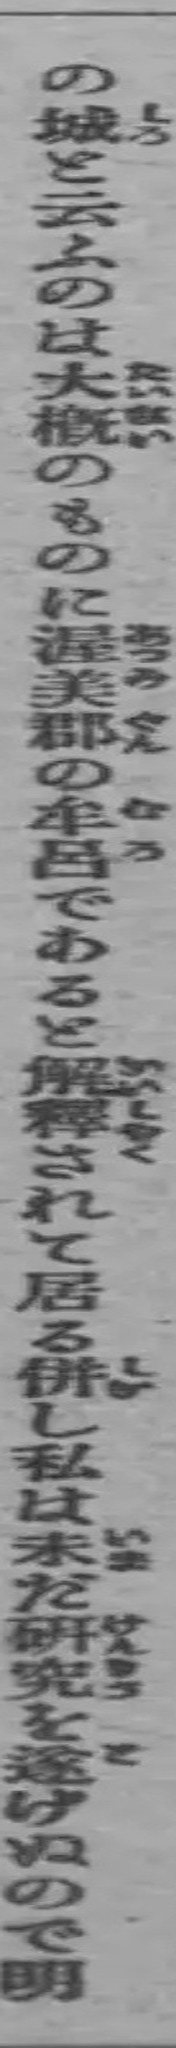の城と云ふのは大概のものに渥美郡の牟呂であると解釈されて居る併し私は未だ研究を遂げぬので明
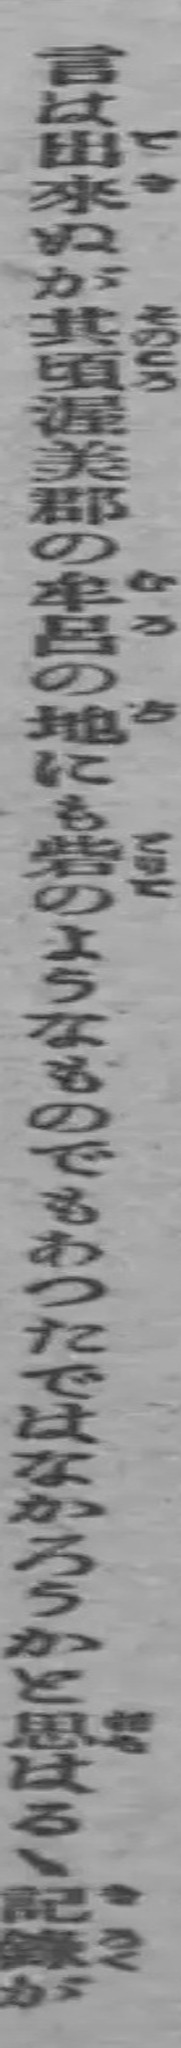言は出来ぬが其頃渥美郡の牟呂の地にも砦のようなものでもあつたのではなかろうかと思はるゝ記録が
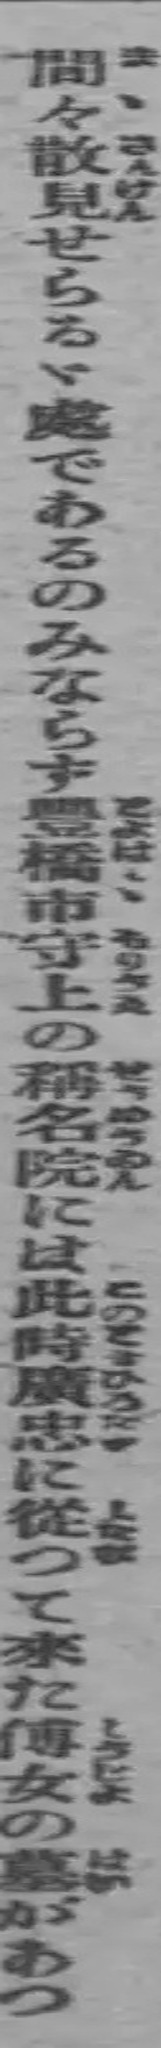間々散見せらるゝ処であるのみならず豊橋市守上の称名院には此時広忠に従つて来た傅女の墓があつ
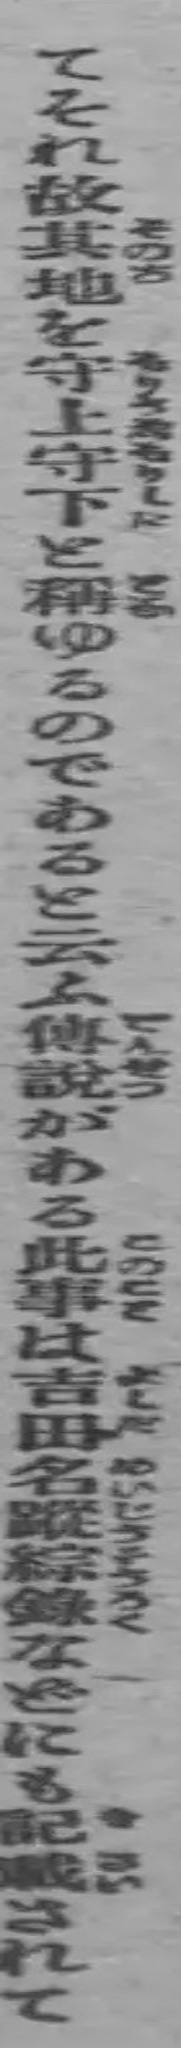てそれ故其地を守上守下と称ゆるのであると云ふ伝説がある此事は吉田名蹤綜録などにも記載されて
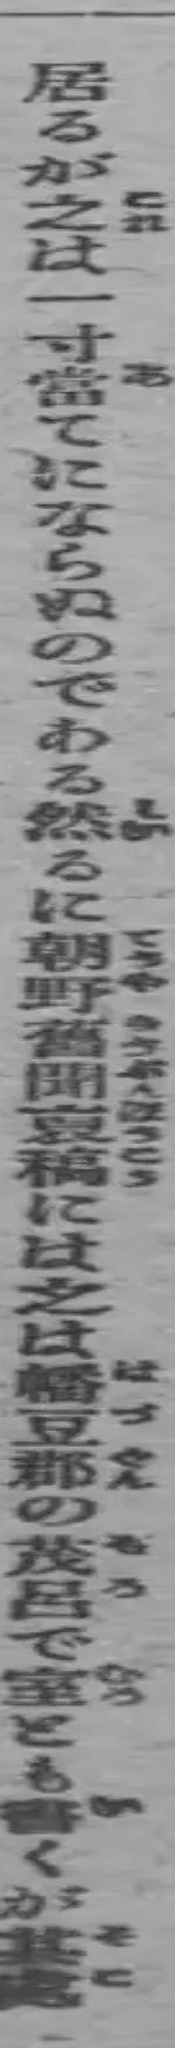居るが之は一寸当てにならぬのである然るに朝野旧聞裒稿には之は幡豆郡の茂呂で室とも書くが其処
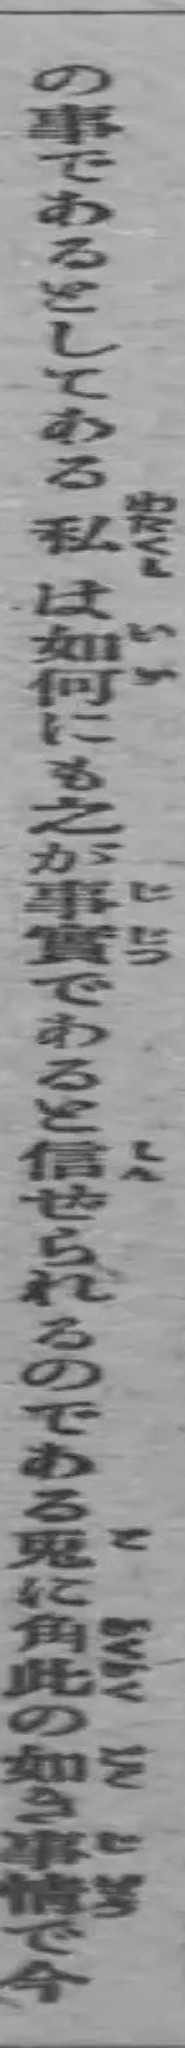の事であるとしてある私は如何にも之が事実であると信ぜられるのである兎に角此の如き事情で今
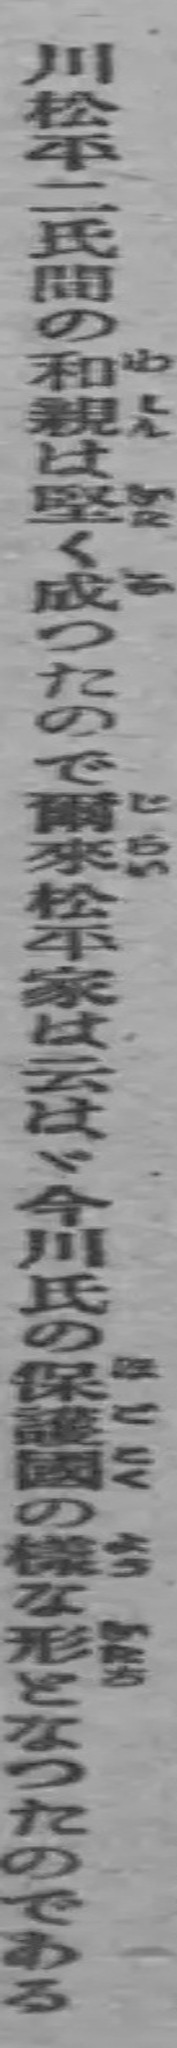川松平二氏間の和親は堅く成つたので爾来松平家は云はゞ今川氏の保護国の様な形となつたのである
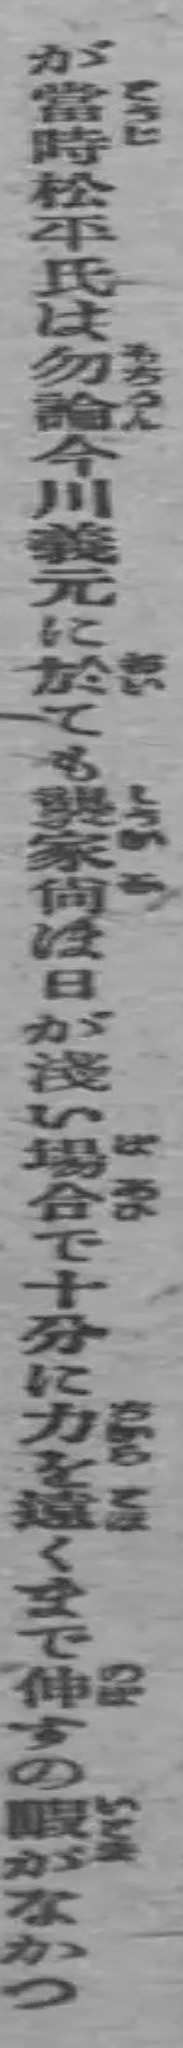が当時松平氏は勿論今川義元に於ても襲家尚ほ日が浅い場合で十分に力を遠くまで伸すの暇がなかつ
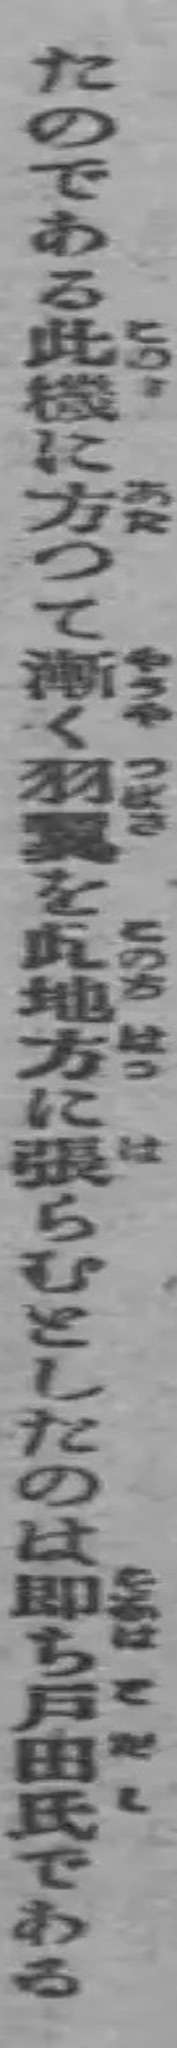たのである此機に方つて漸く羽翼を此地方に張らむとしたのは即ち戸田氏である
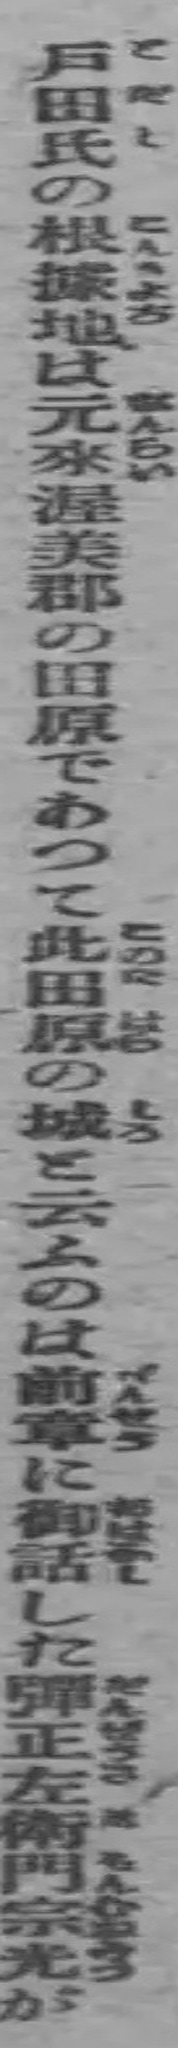戸田氏の根拠地は元来渥美郡の田原であつて此田原の城と云ふのは前章に御話した弾正左衛門宗光が
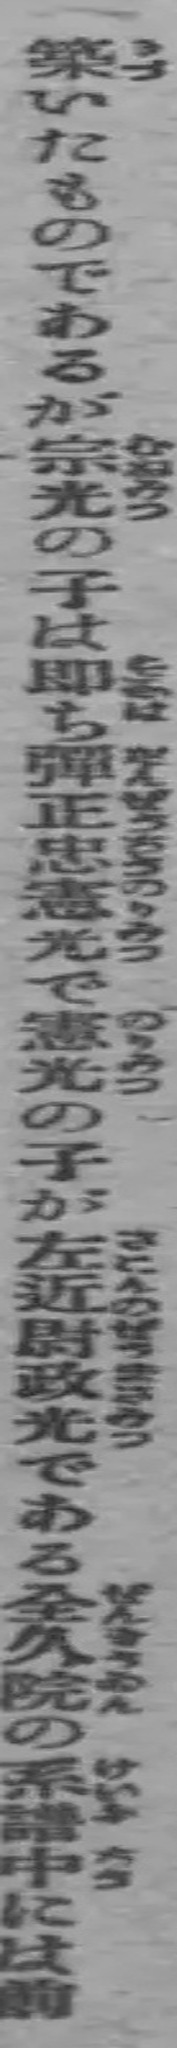築いたものであるが宗光の子は即ち弾正忠憲光で憲光の子が左近尉政光である全久院の系譜中には前
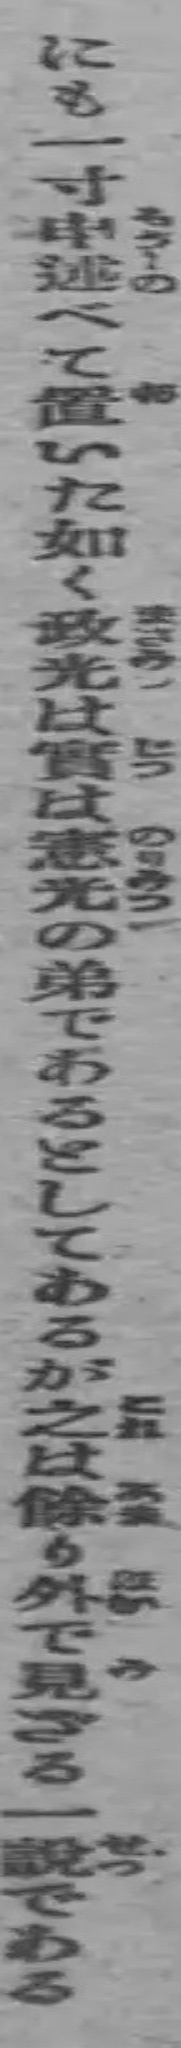にも一寸申述べて置いた如く政光は実は憲光の弟であるとしてあるが之は余り外で見ざる一説である
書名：豊橋市史談
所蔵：国立国会図書館 National Diet Library, JAPAN
